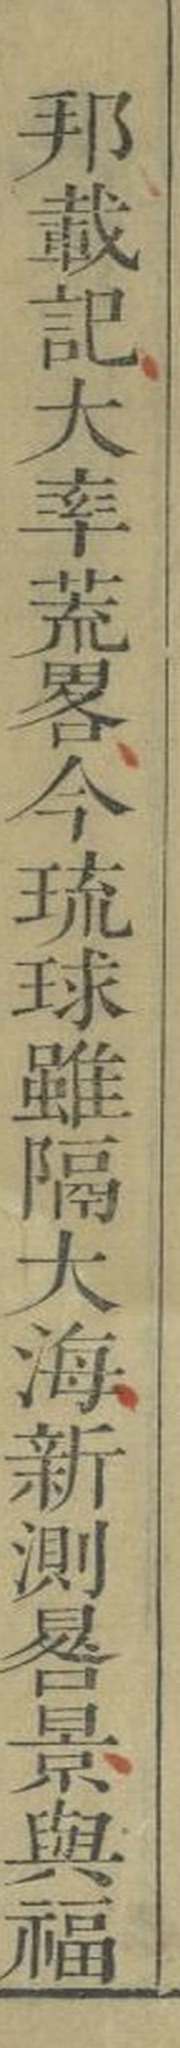邦載記大率荒畧今琉球雖隔大海新測晷景與福
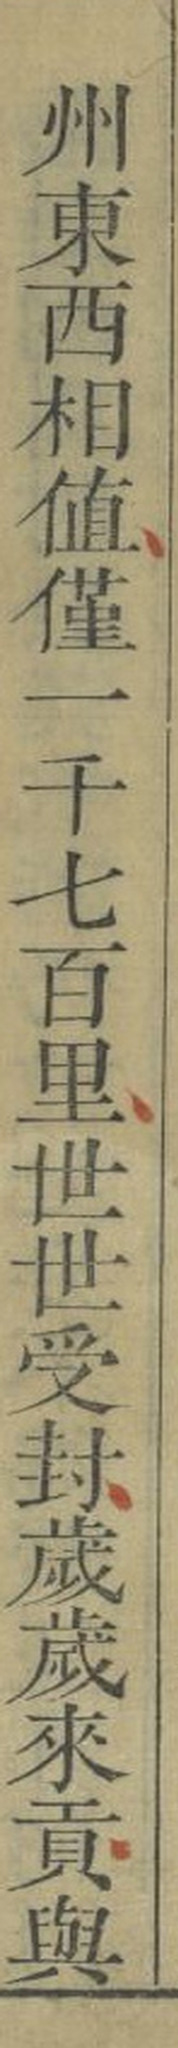州東西相値僅一千七百里世世受封歲歲來貢與
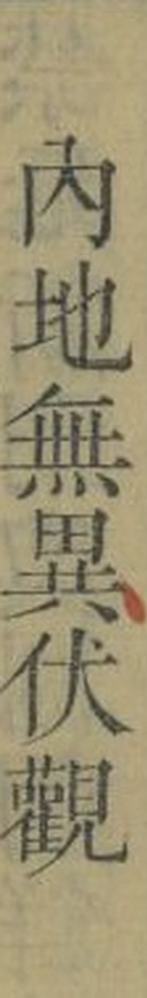内地無異伏觀

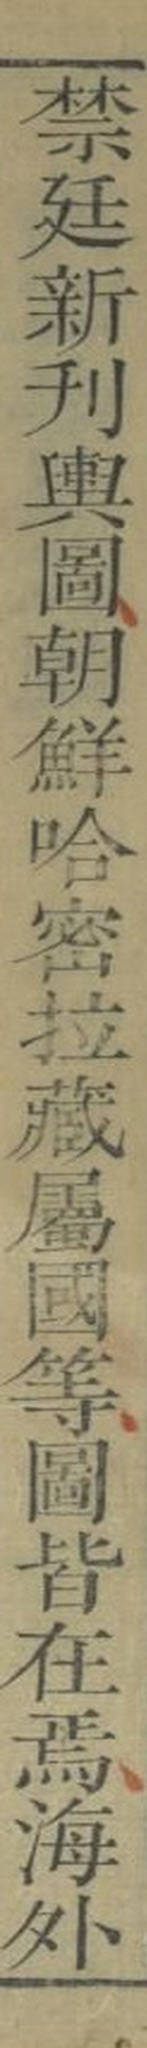禁廷新刊輿圖朝鮮哈密拉藏屬國等圖皆在焉海外
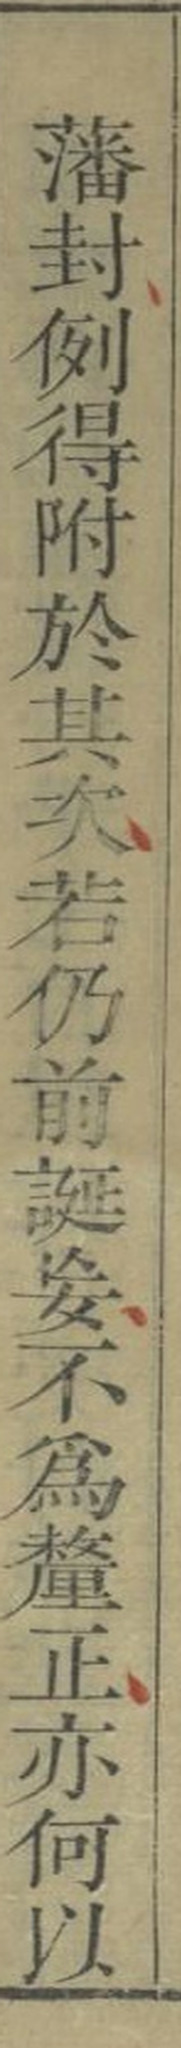藩封例得附於其次若仍前誕妄不爲釐正亦何以
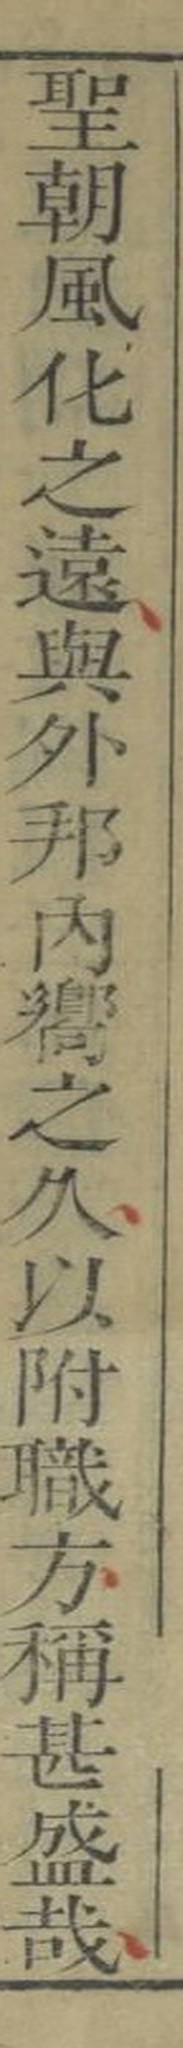聖朝風化之遠與外邦内嚮之久以附職方稱甚盛哉
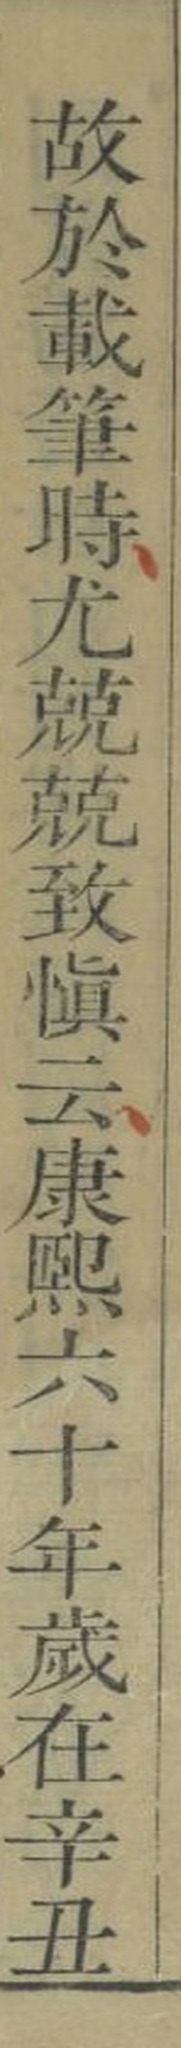故於載筆時尤兢兢致愼云康煕六十年歲在辛丑
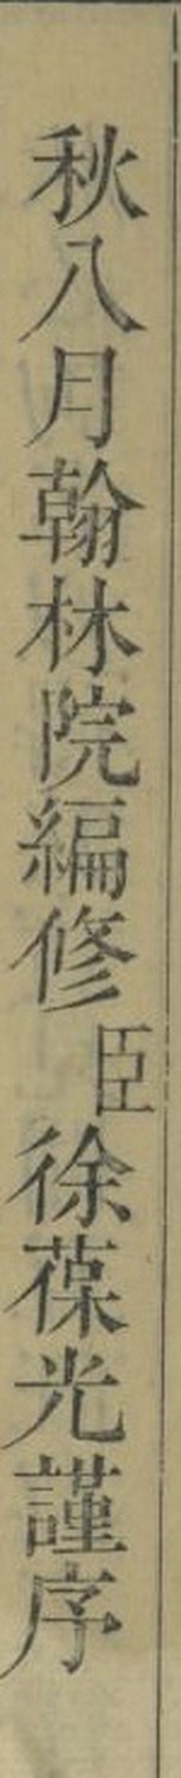秋八月翰林院編修臣徐葆光謹序
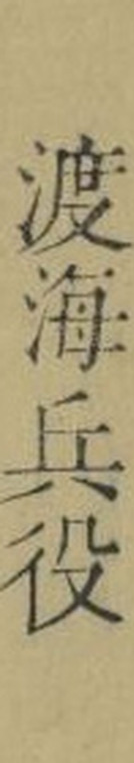渡海兵役
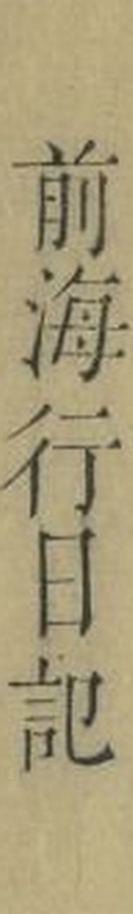前海行日記
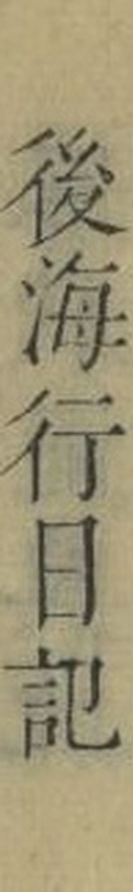後海行日記
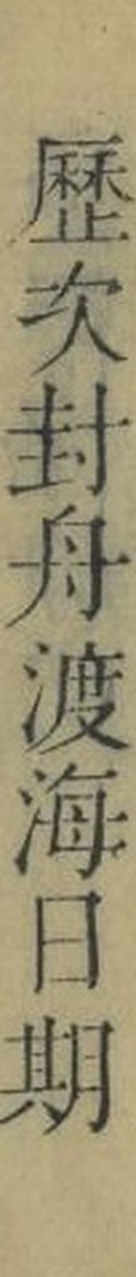歷次封舟渡海日期

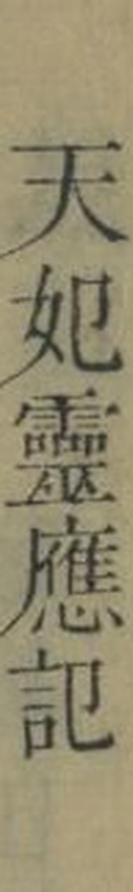天妃靈應記
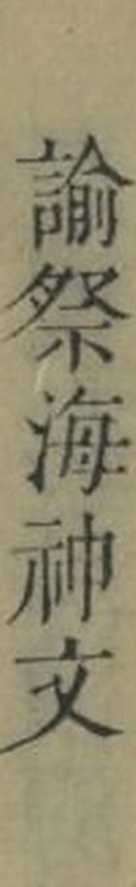諭祭海神文
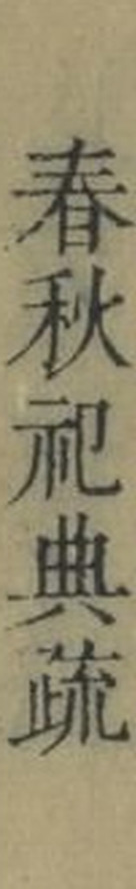春秋祀典疏

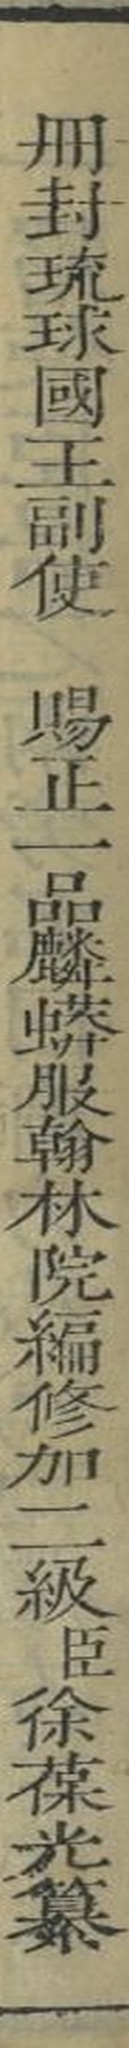冊封琉球國王副使賜正一品麟蟒服翰林院編修加二級臣徐葆光纂
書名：中山伝信録 巻一、巻二
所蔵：University of the Ryukyus Library
